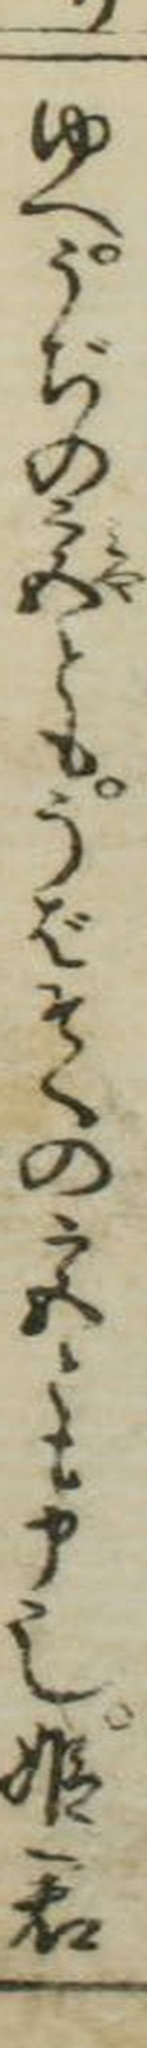ゆへ。うぢの宮とも。うばそくの宮とも申也。姫君
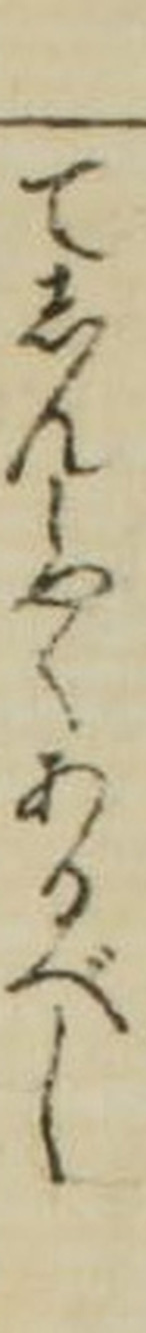てしんしやくあるべし
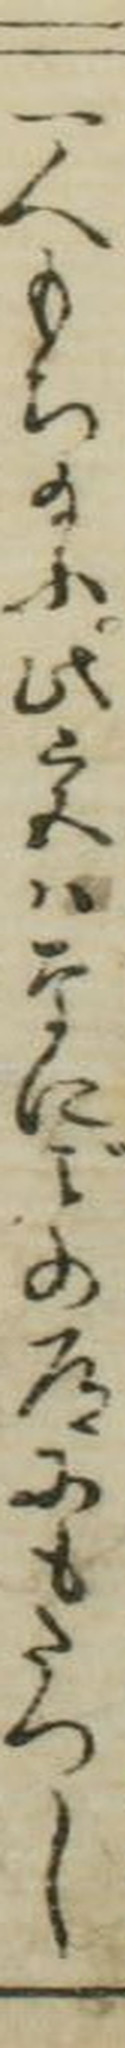一人もち給ふ。此宮はなにごとの道にもたつし
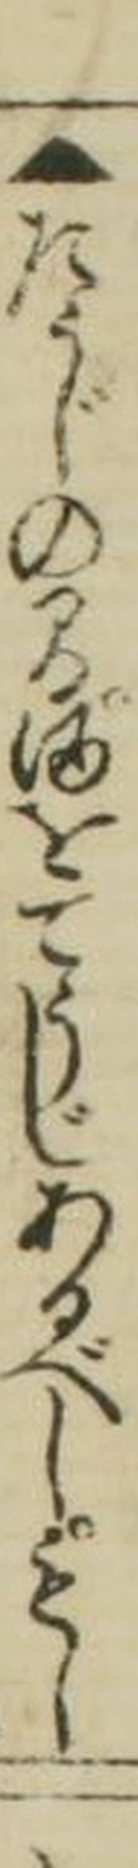▲たうじの間。酒をてうじあるべし。もし
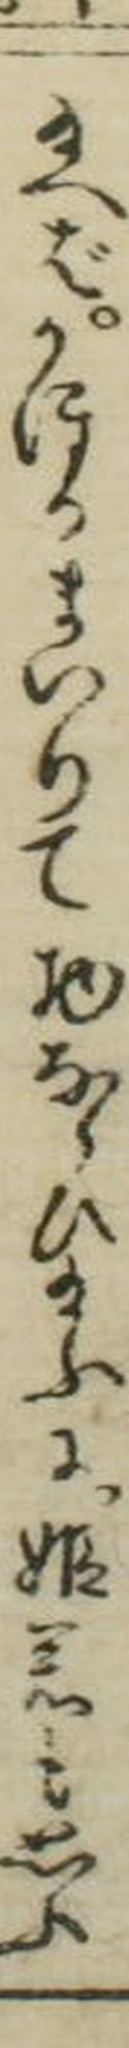給へば。かほるまいりて物ならひ給ふに。姫君も思ふ
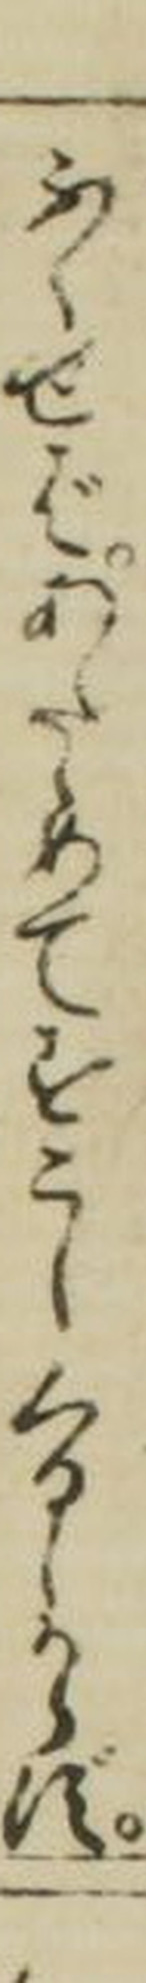ふくせば。あたゝめてすこしくるしからず。
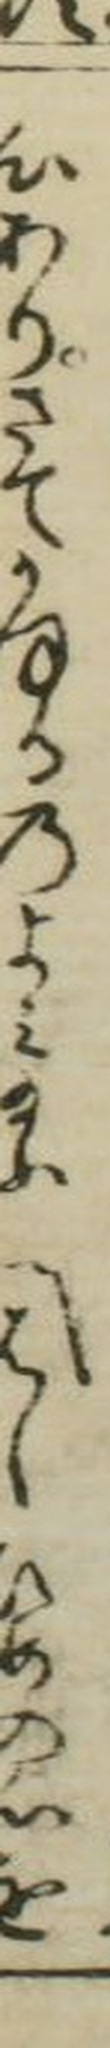心あり。さてかほるのよみ給ふ〽はしひめの心を
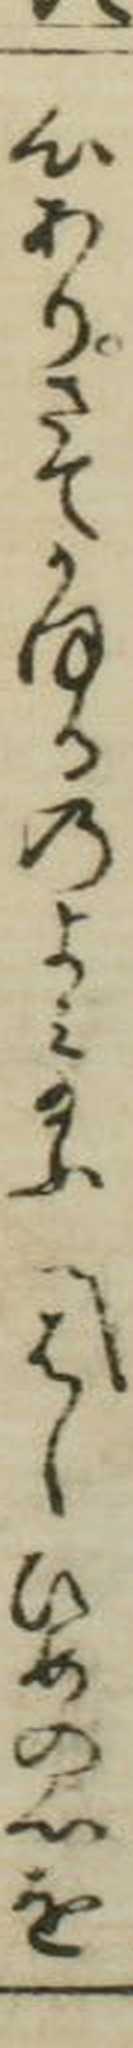心あり。さてかほるのよみ給ふ〽はしひめの心を
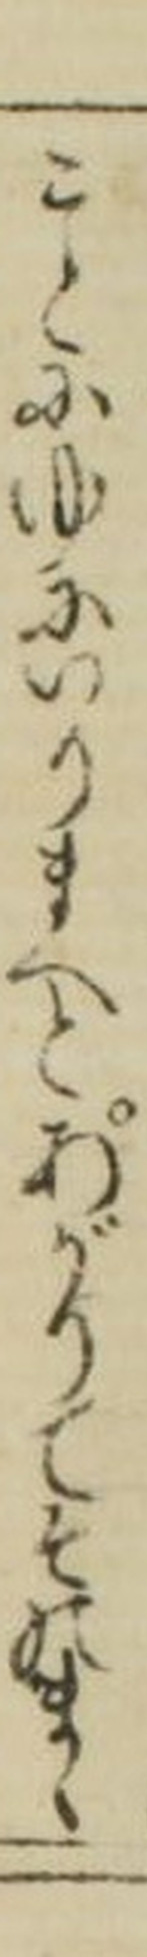ことにゆにいりまへと。あがりてそのまゝ
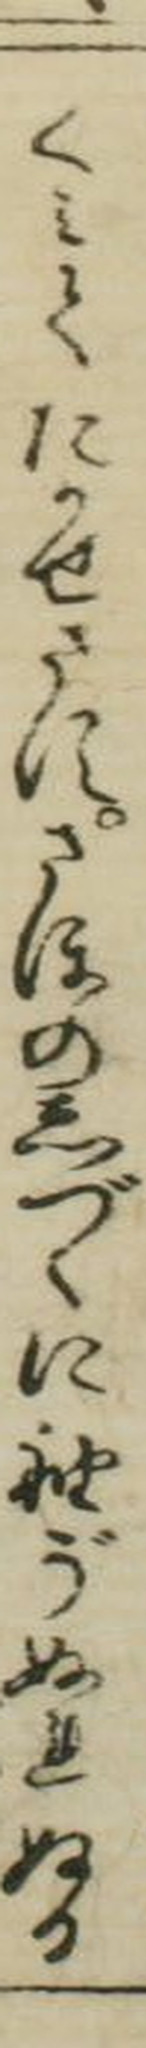くみてたかせさす。さほのしづくに袖ぞぬれぬる
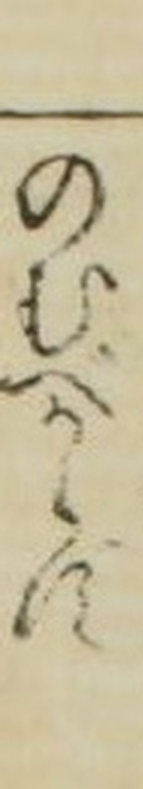のむべからず
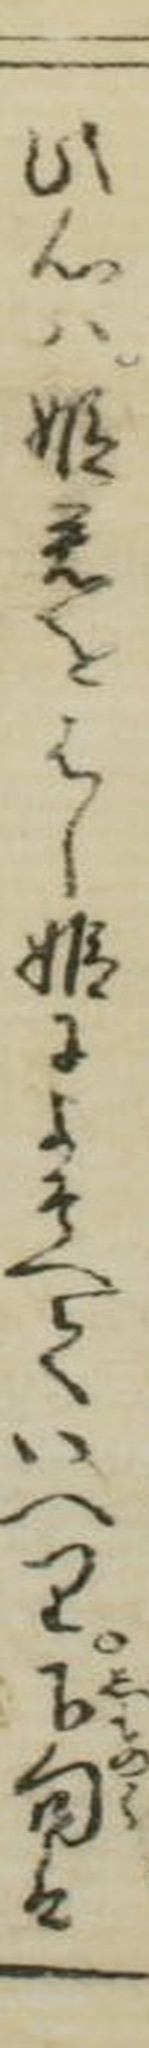此心は。姫君をはし姫によそへていへり。下句は
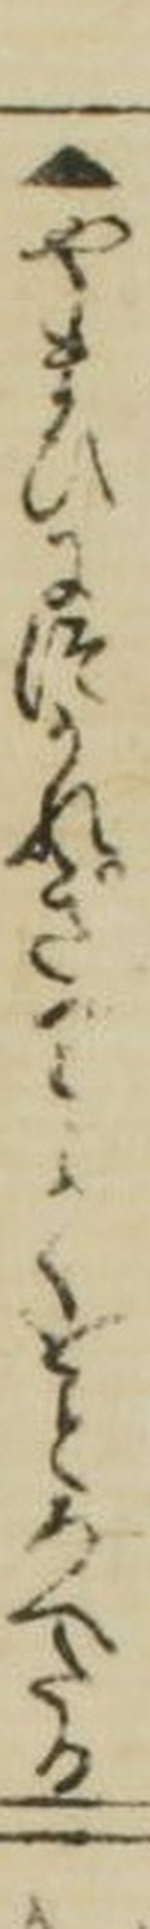▲やまひにつかれ。きりよくをとろへたる
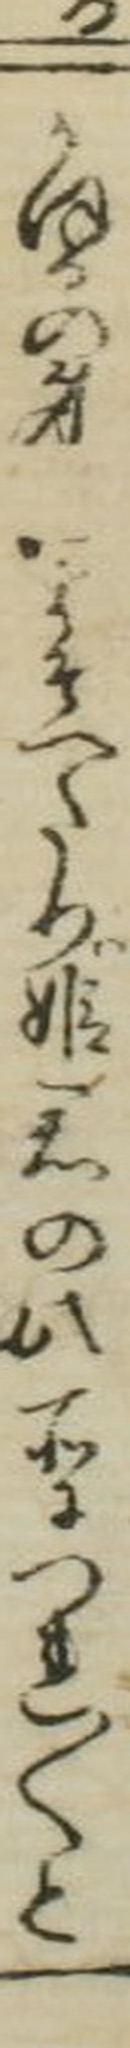かほるの身によそへたり。姫君の此所につれ〳〵と
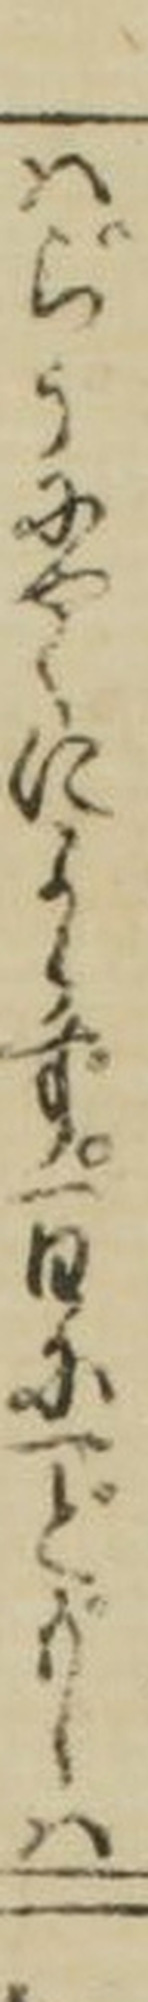は。らうにやくによらず。一日に一ど。もしは
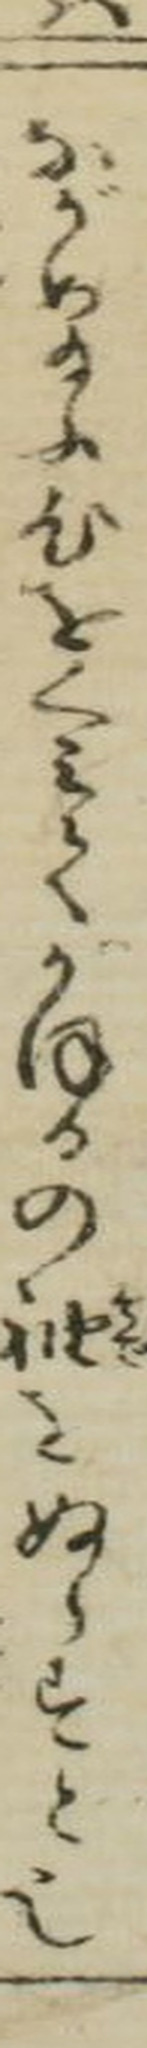ながめ給ふ心をくみて。かほるの袖をぬらすと也
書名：女源氏教訓鑑
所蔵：東京学芸大学附属図書館
